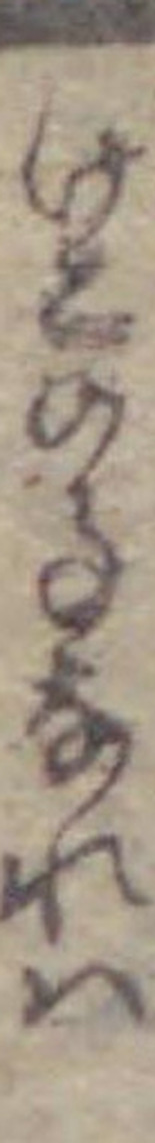けこの事なれは
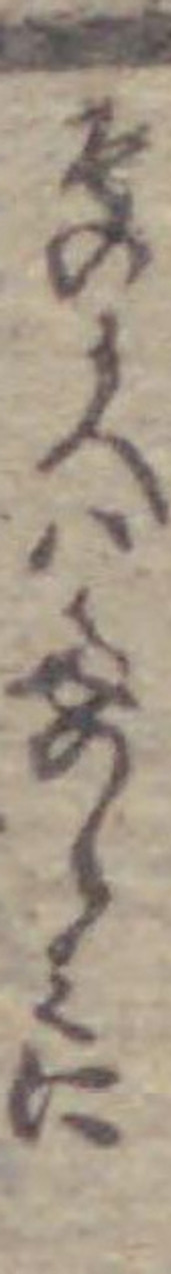そのうへはたのしみに
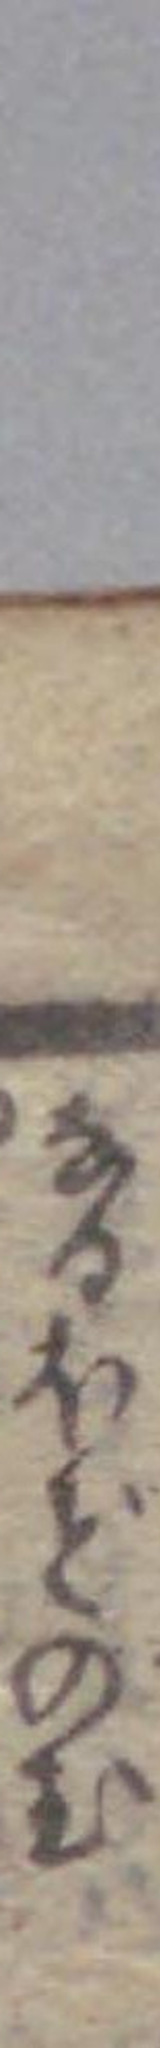なるほどのむ
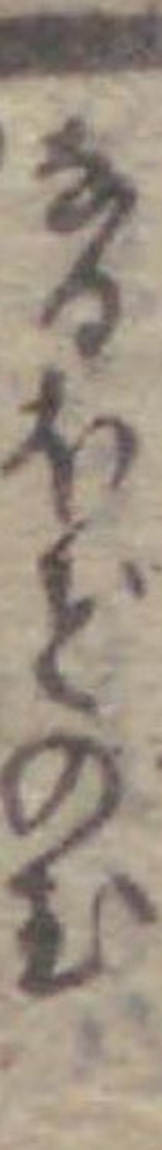なるほどのむ
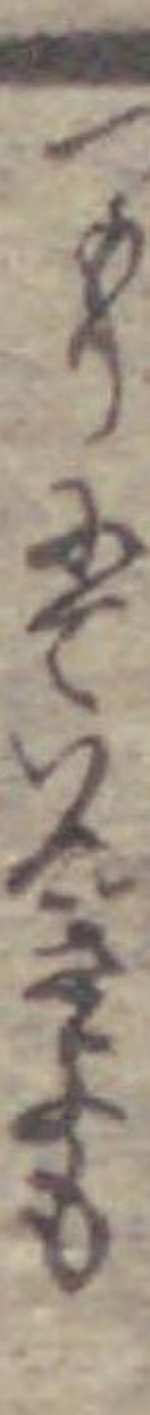つもりにていんきよも
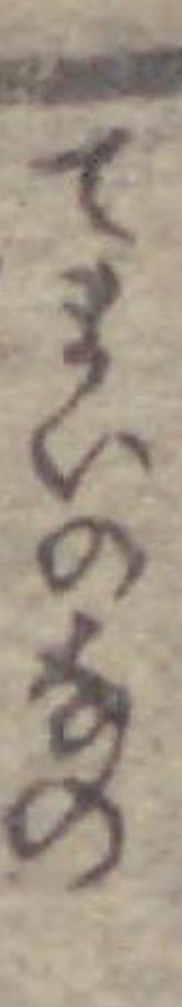てまいのなの
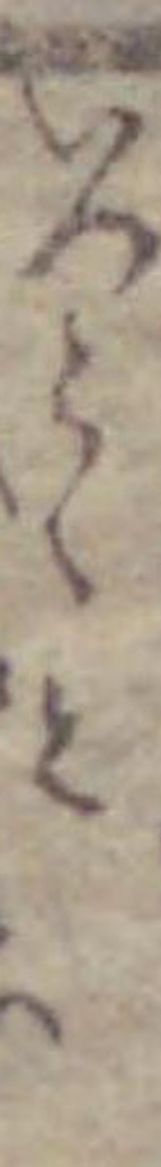いつとくと
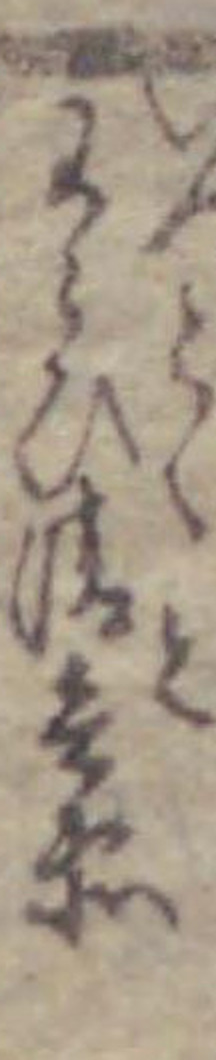わらひ清兵衛
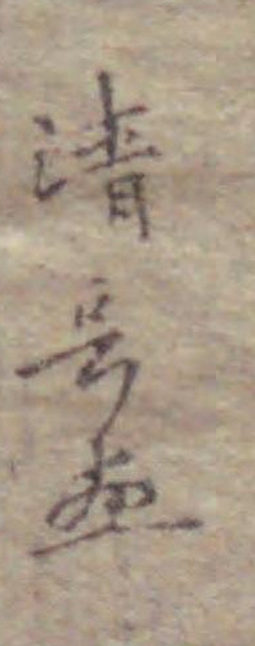清長画
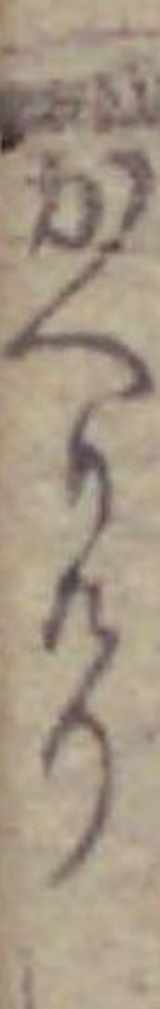かへりけり
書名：見通占 : 3巻
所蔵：国立国会図書館 National Diet Library, JAPAN
